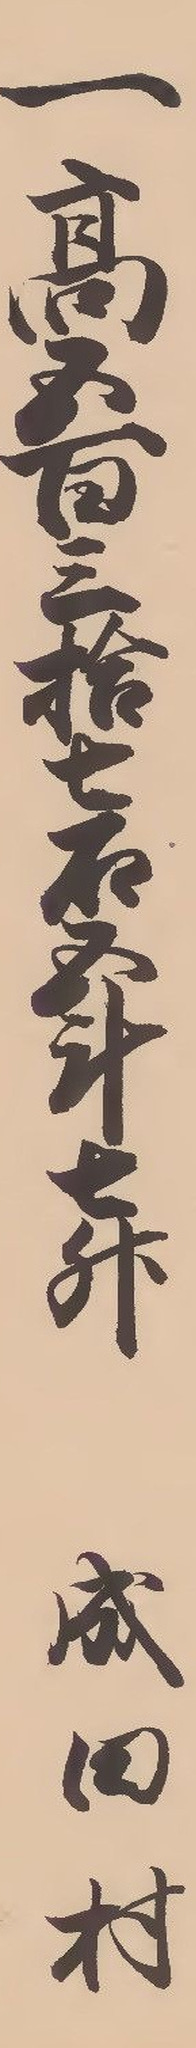一高五百三拾七石五斗七升成田村

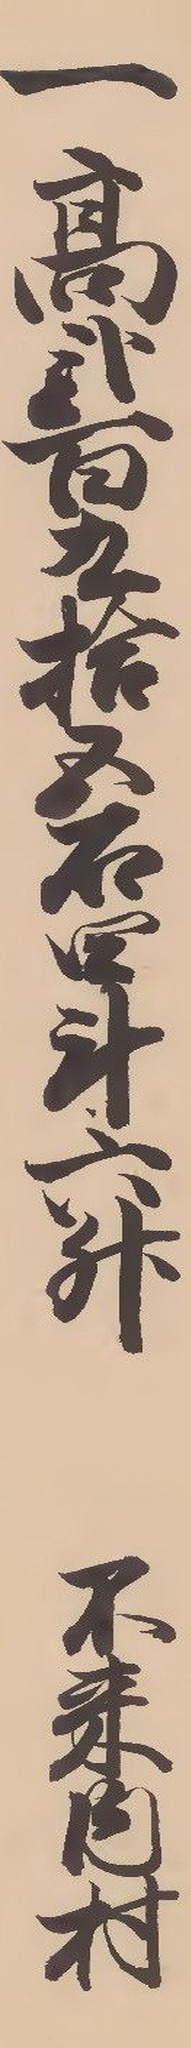一高弐百九拾五石四斗六升不来内村
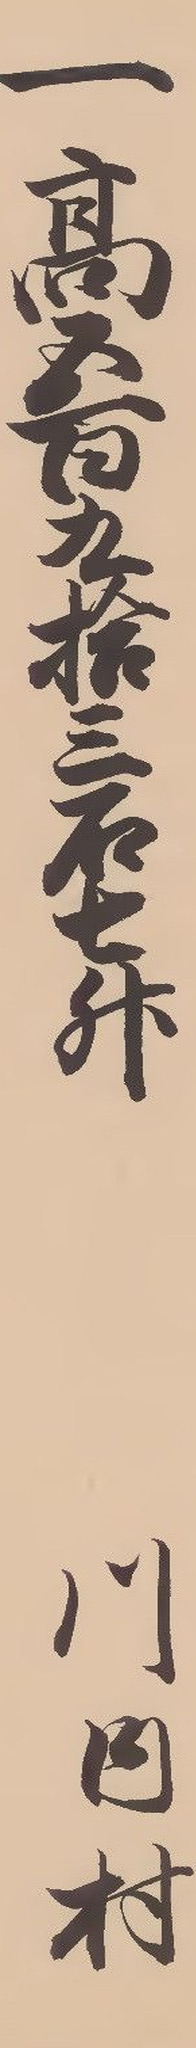一高五百九拾三石七升川内村
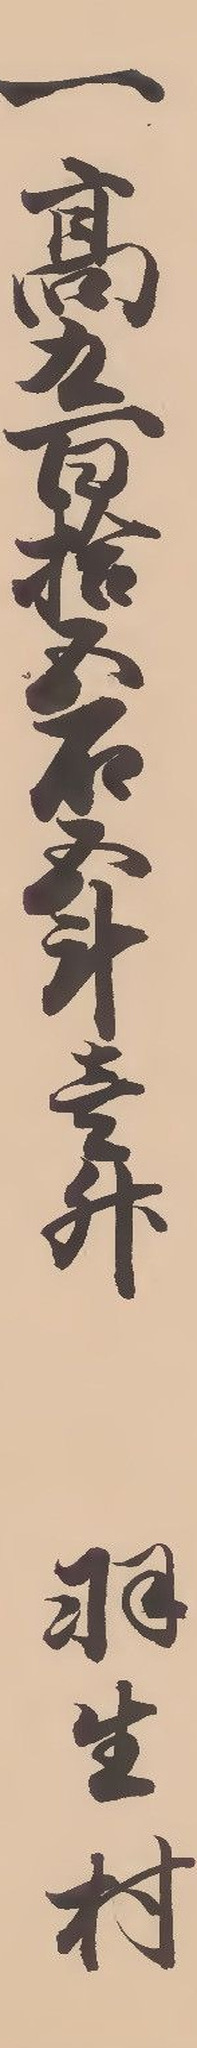一高九百拾五石五斗壱升羽生村
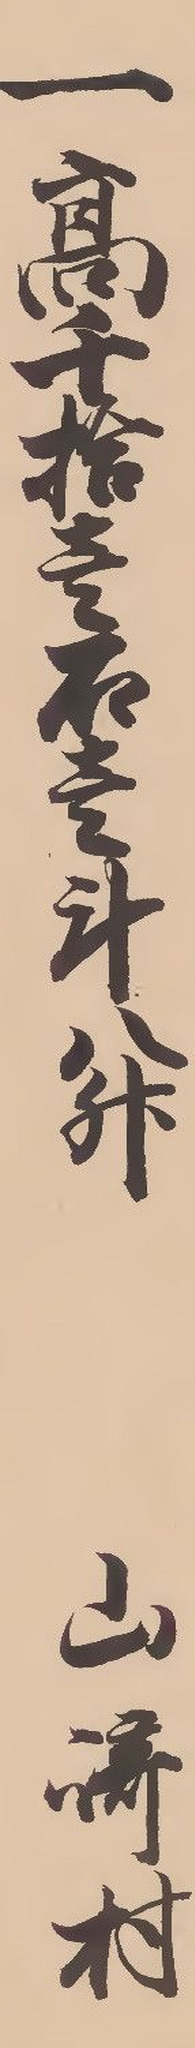一高千拾壱石壱斗八升山崎村
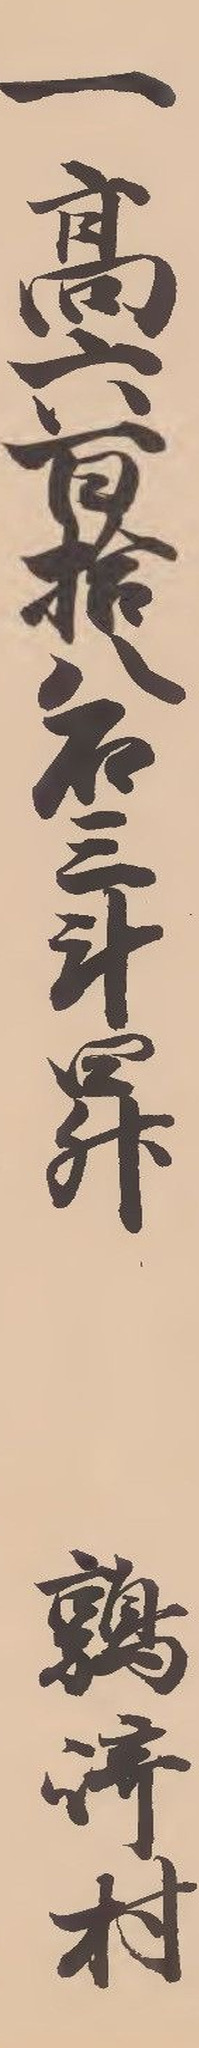一高六百拾八石三斗四升鶉崎村
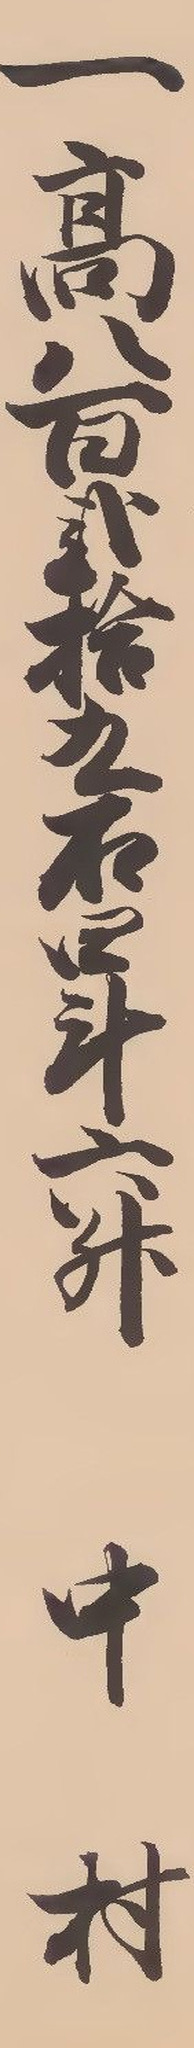一高八百弐拾九石四斗六升中村
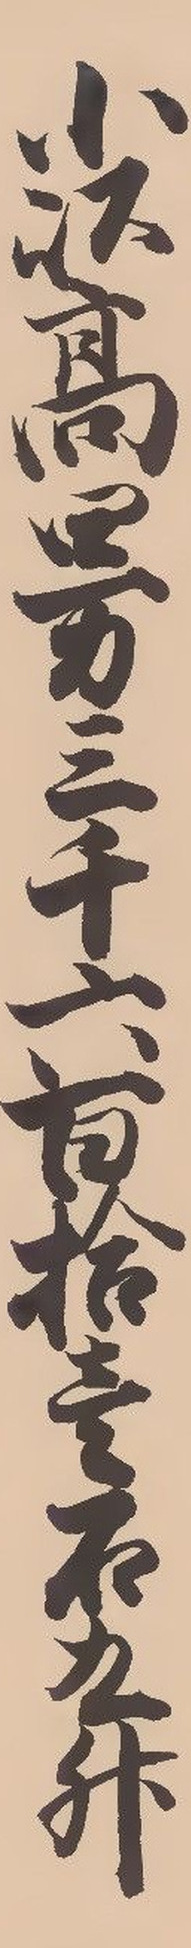小以高四万三千六百拾壱石九升

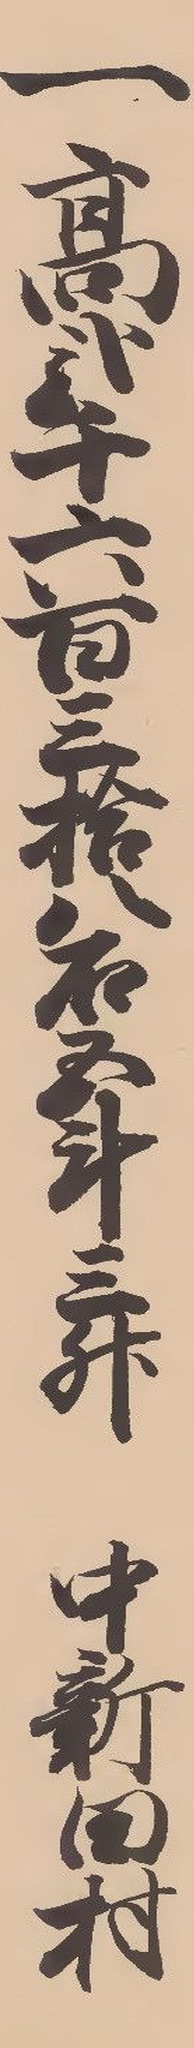一高弐千六百三拾八石五斗三升中新田村
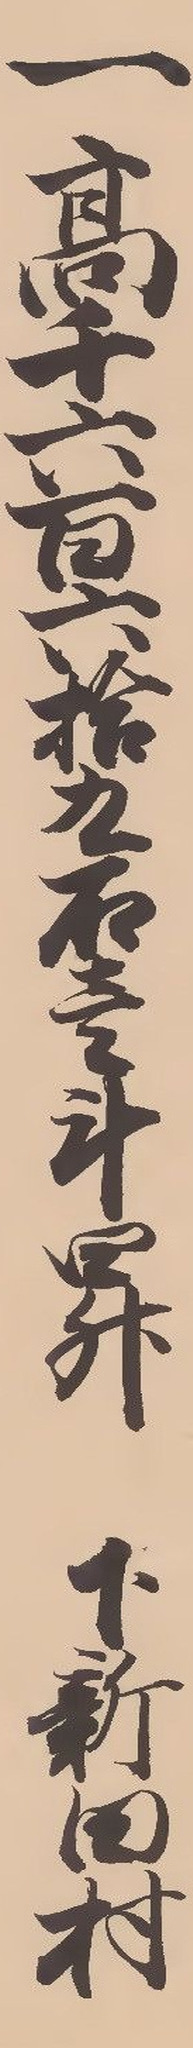一高千六百六拾九石壱斗四升下新田村
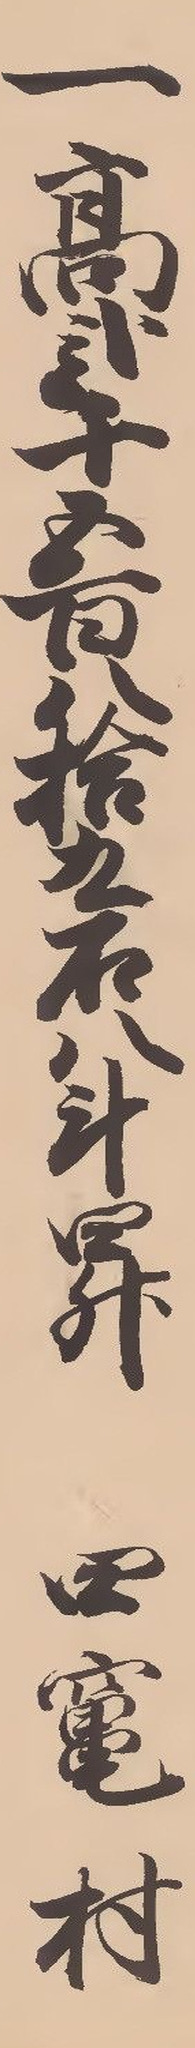一高弐千五百八拾九石八斗四升四竈村
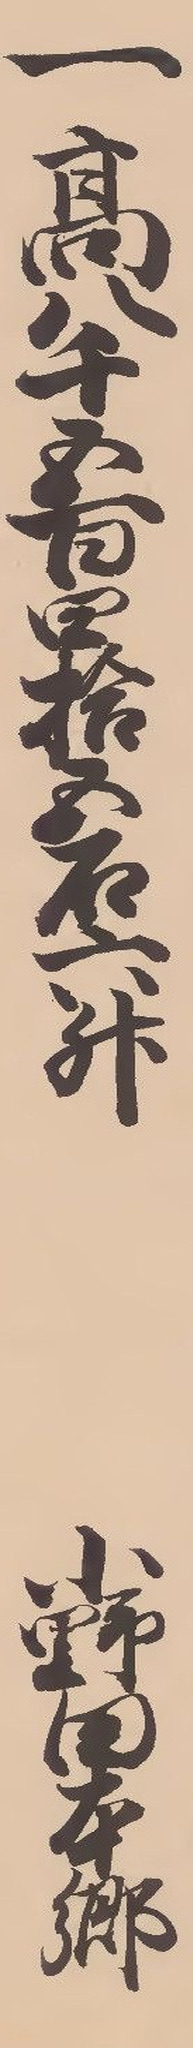一高八千五百四拾五石六升小野田本郷
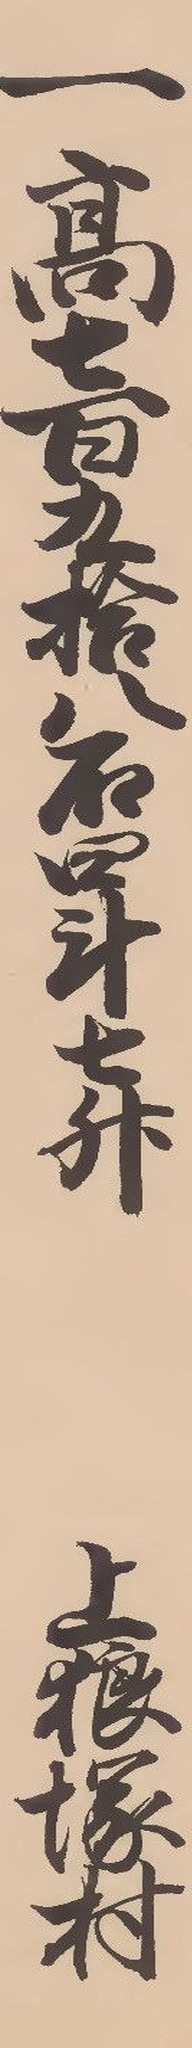一高七百九拾八石四斗七升上狼塚村
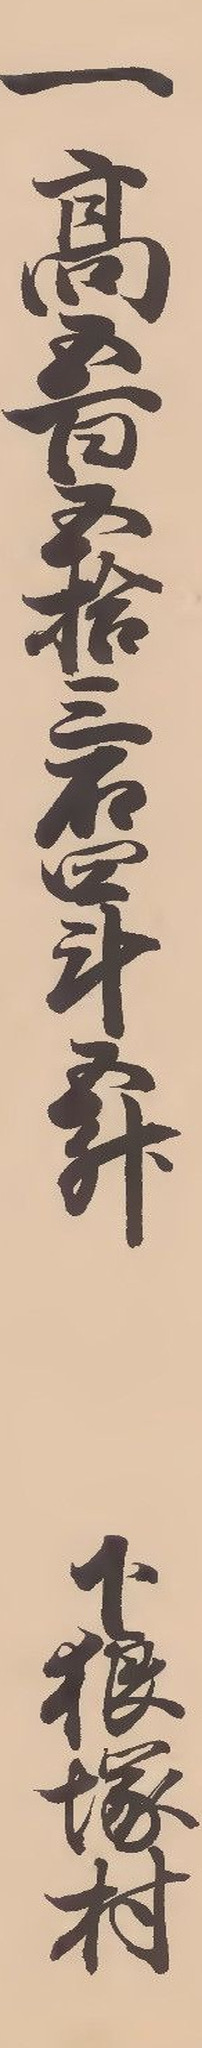一高五百五拾三石四斗五升下狼塚村
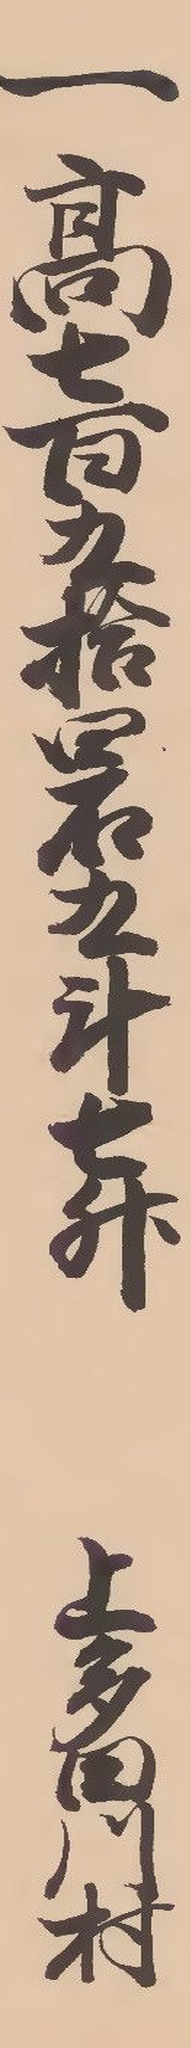一高七百九拾四石九斗七升上多田川村

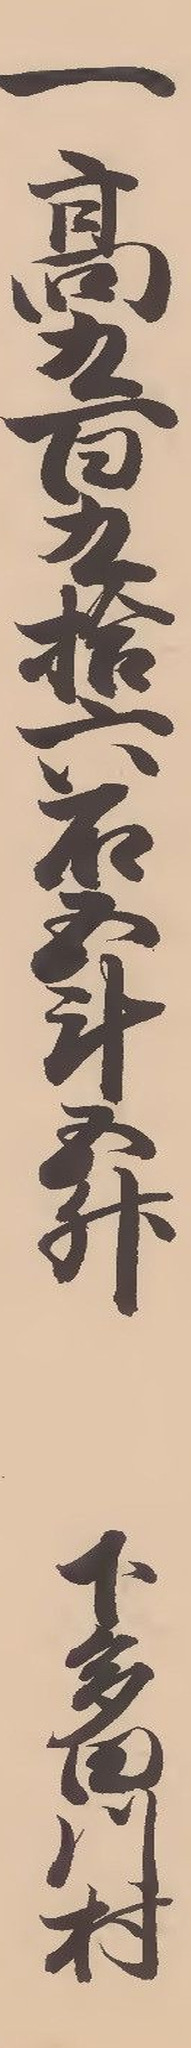一高九百九拾六石五斗五升下多田川村
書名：陸奥国郷帳　５
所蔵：国立公文書館 National Archives of Japan
